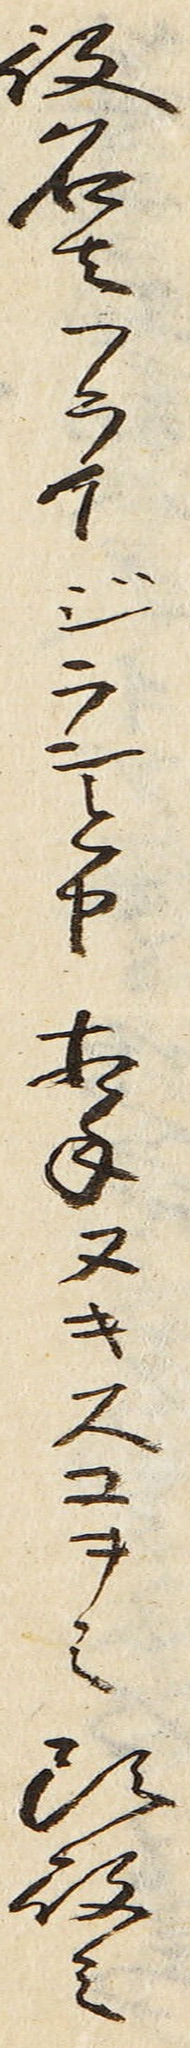役名はフライジランと申相手ヌキスコヲ之頭役之
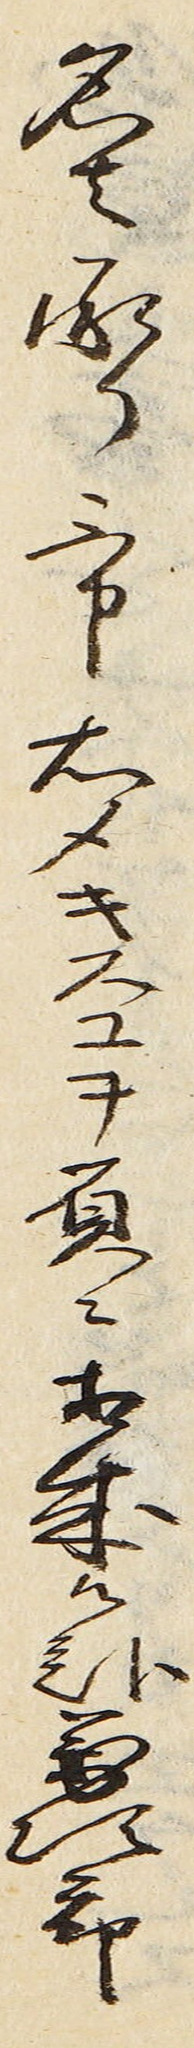名は承り不申右メキスコヲ負に相成候を万次郎
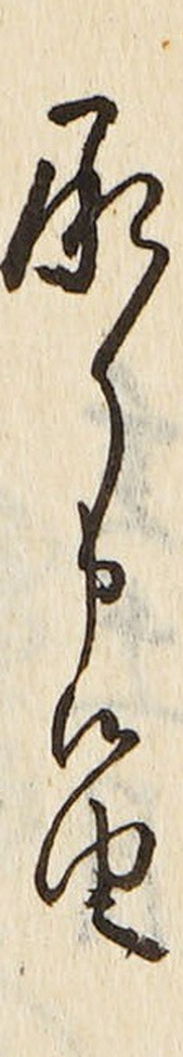承り申候由
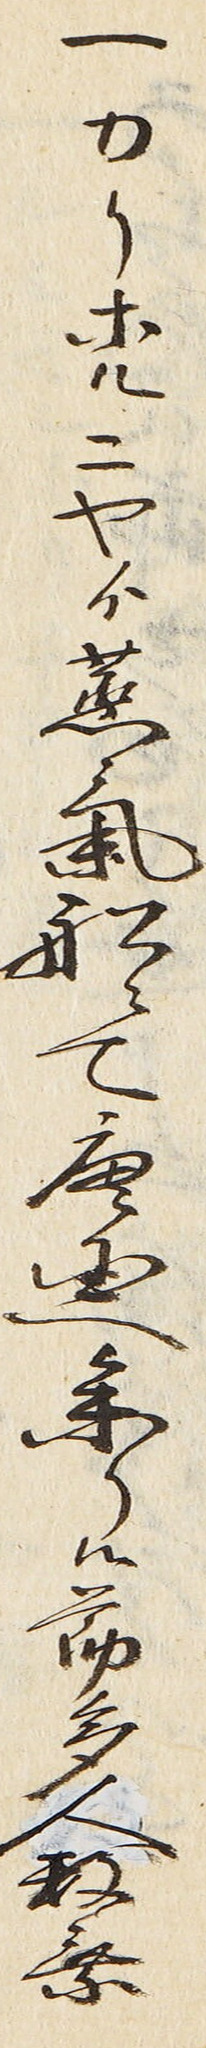一カリホルニヤゟ蒸気船にて唐国へ参り候節多人数乗
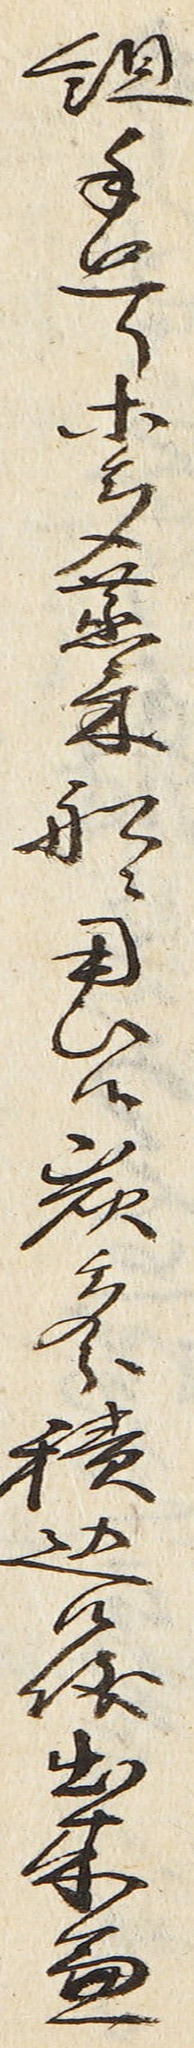組手廻り等多蒸気船に用ひ候炭多分積込候儀出来兼
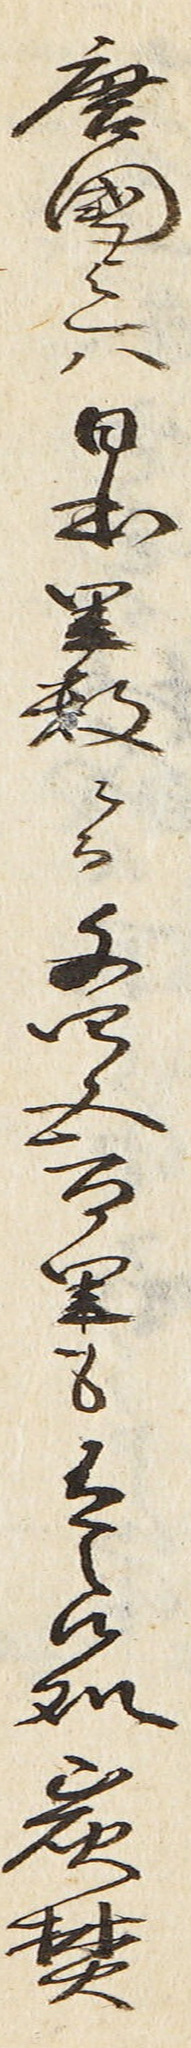唐国迄は日本理数に而千四五百里も有之候処炭焚
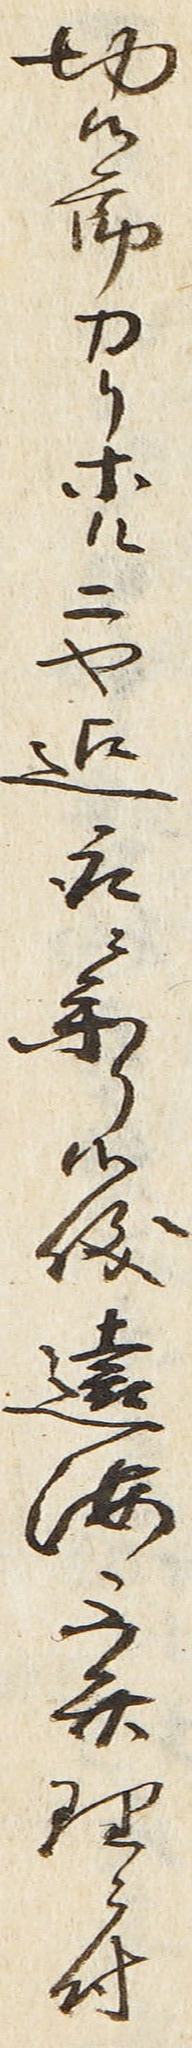切候節カリホルニヤ迄取りに取に参り候儀遠海不弁理に付
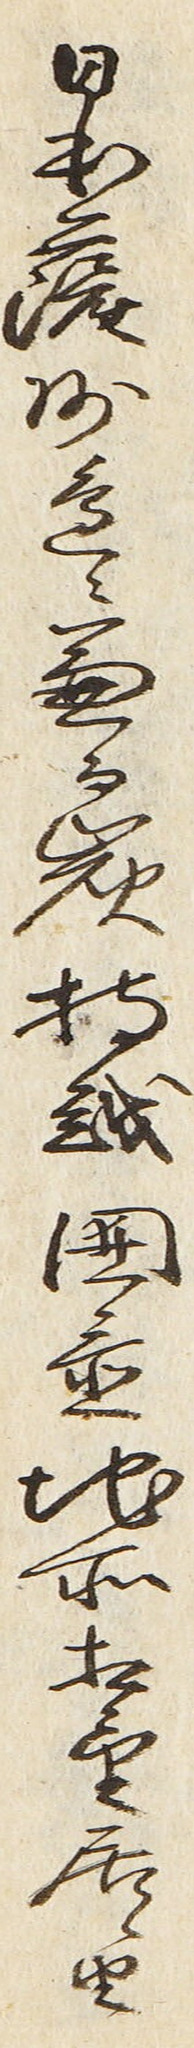日本薩州辺に兼而炭持越囲置地所相望居候由
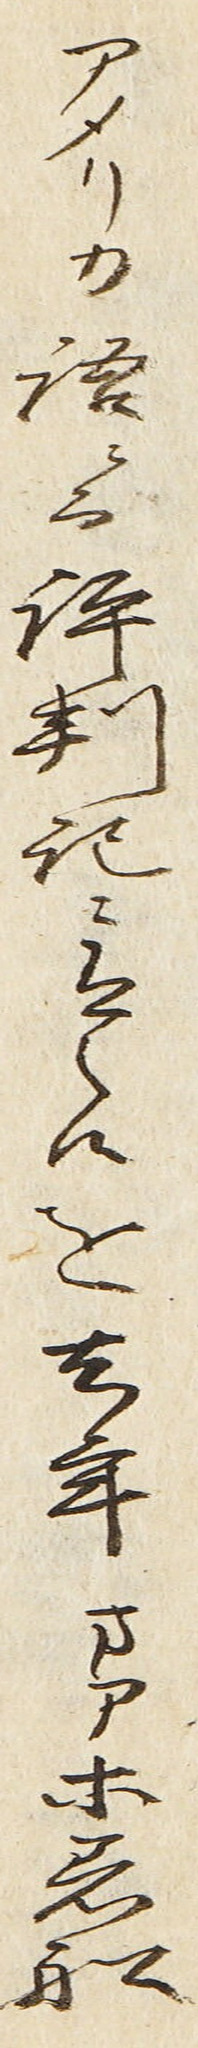アメリカ語に而評判記に有之候を去年オアホ着船
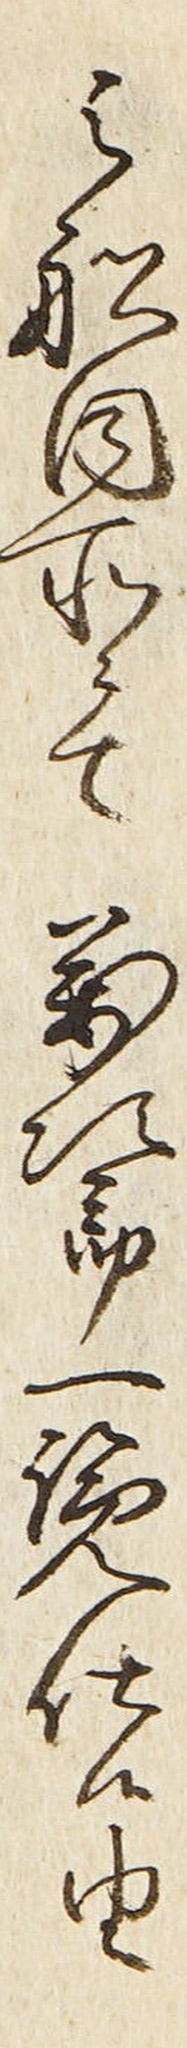之船同所にて万次郎一覧仕候由
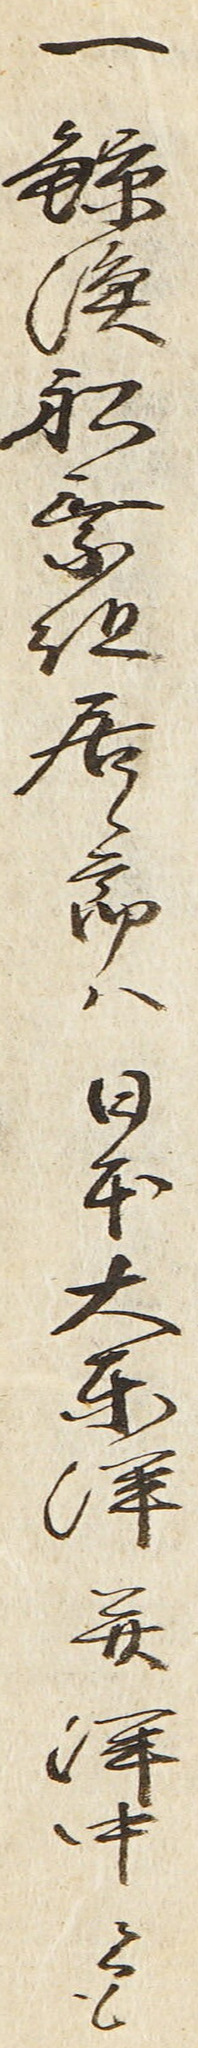一鯨漁船乗組居候節は日本大東洋并洋中に而も
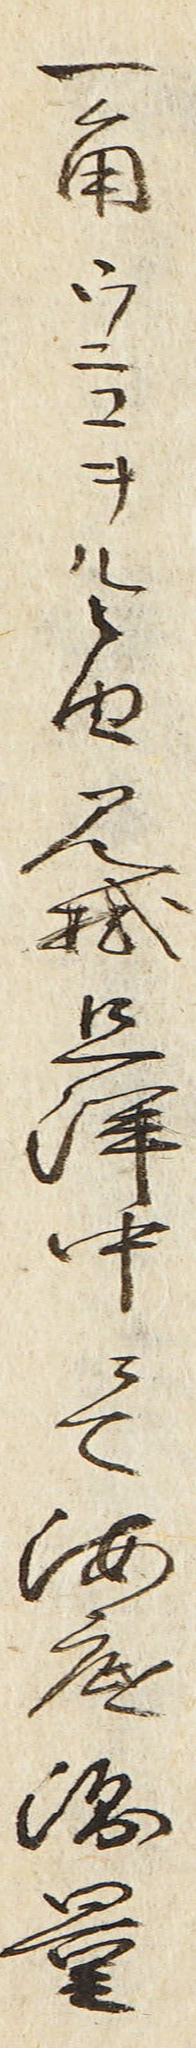一角ウニコヲル之由見掛且洋中にて海底測量

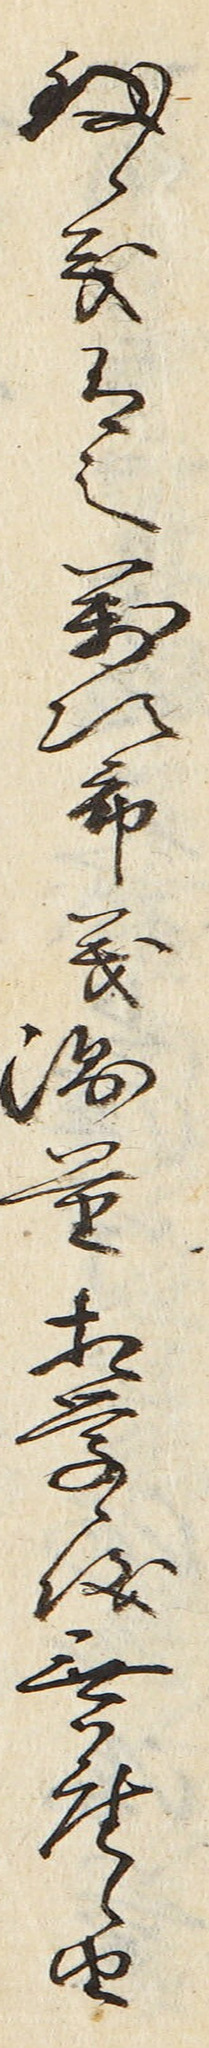致候義有之万次郎義測量相学候儀無御座候由
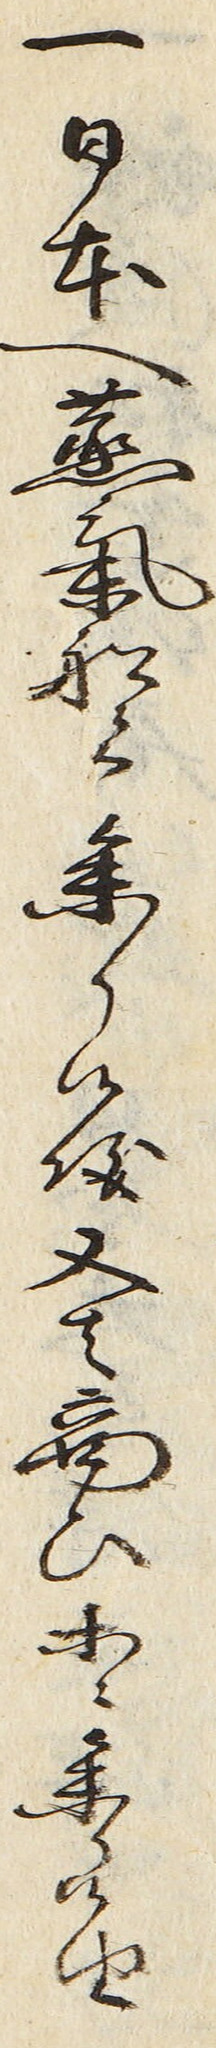一日本へ蒸気船に而参り候儀又は商ひ等に参り候由
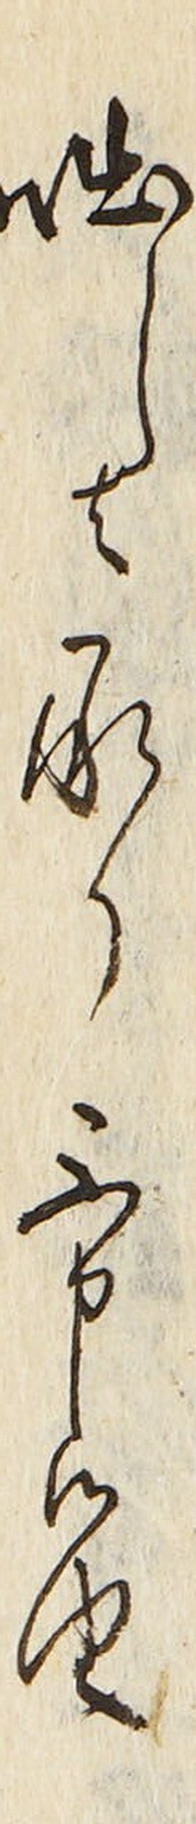咄は承り不申候由
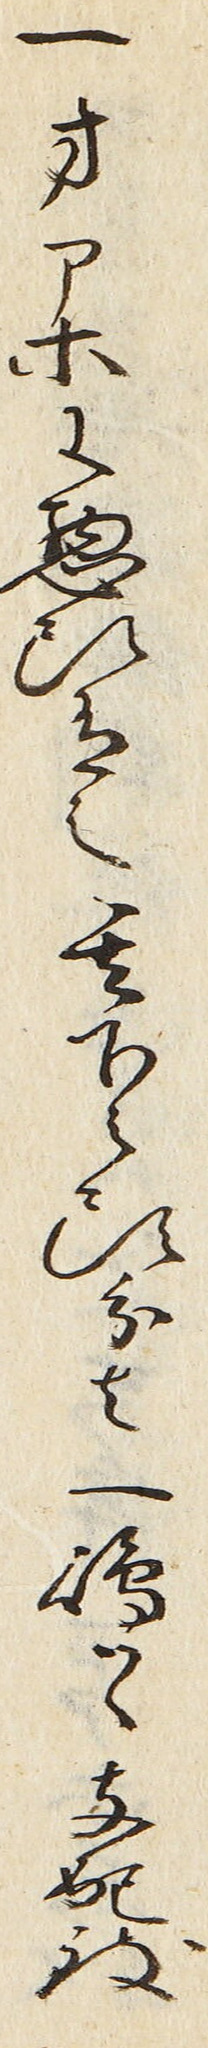一オアホに惣頭有之其下之頭分は一嶋ッヽ支配致
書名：土佐中浜万次郎漂流記
